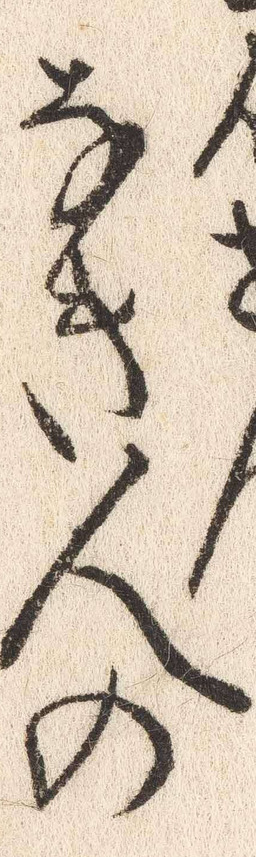なき人の

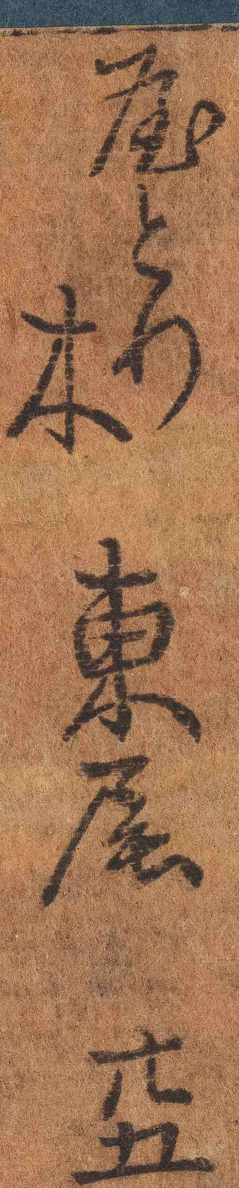やとり木東屋廿五

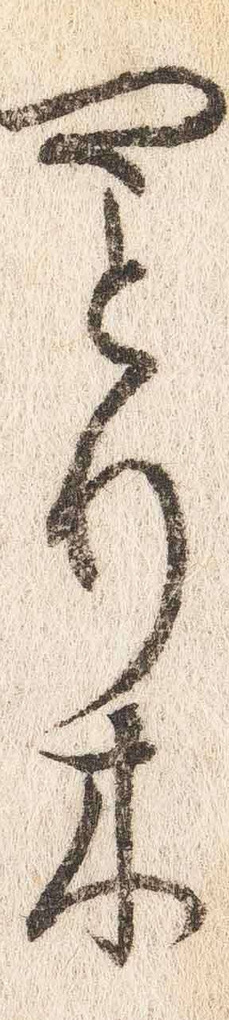やとり木
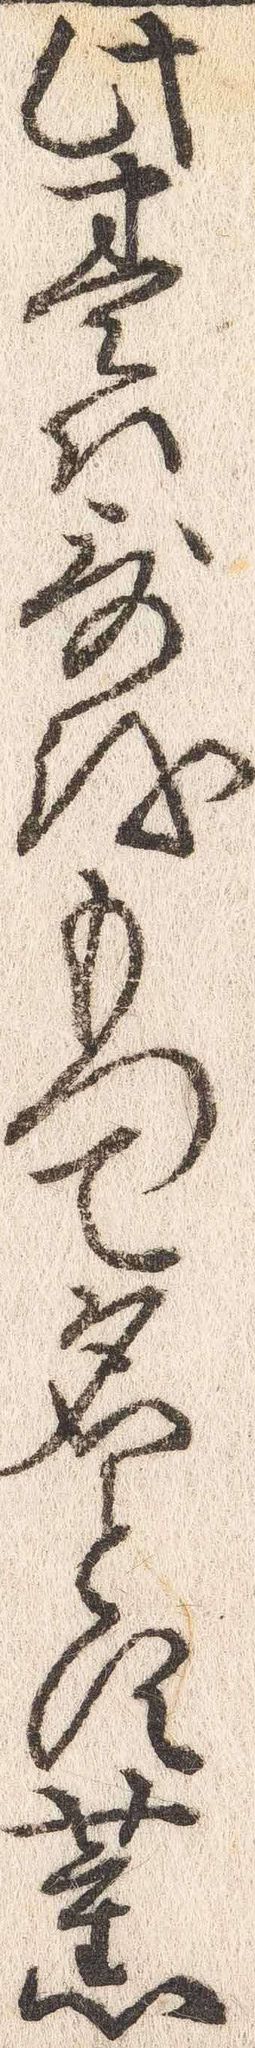此巻は哥をもつて名とす薫
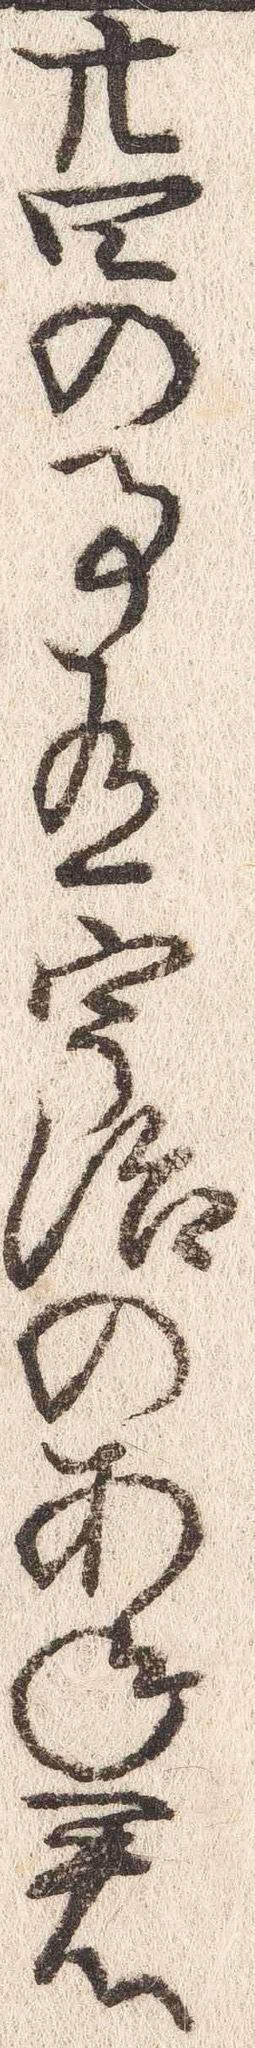廿四の事有宇治のあね君
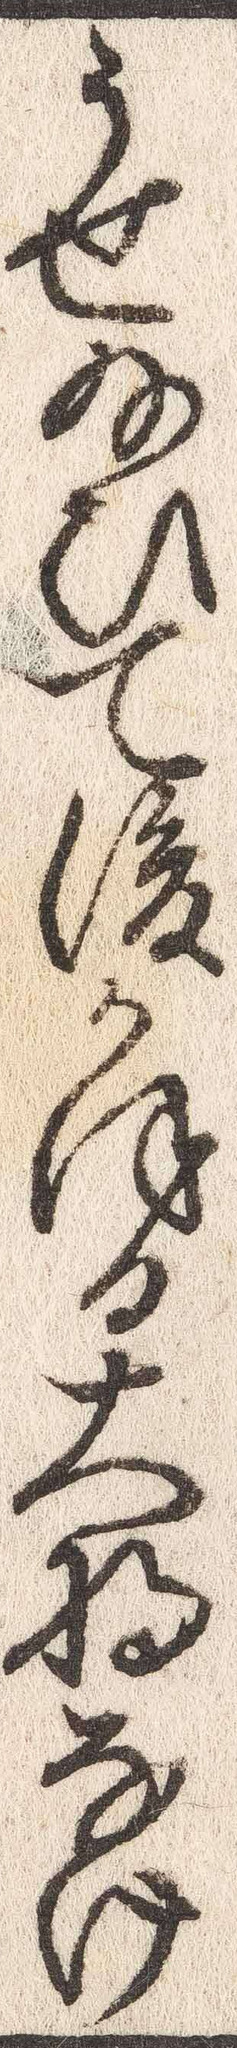うせ給ひて後かほる大将なけ
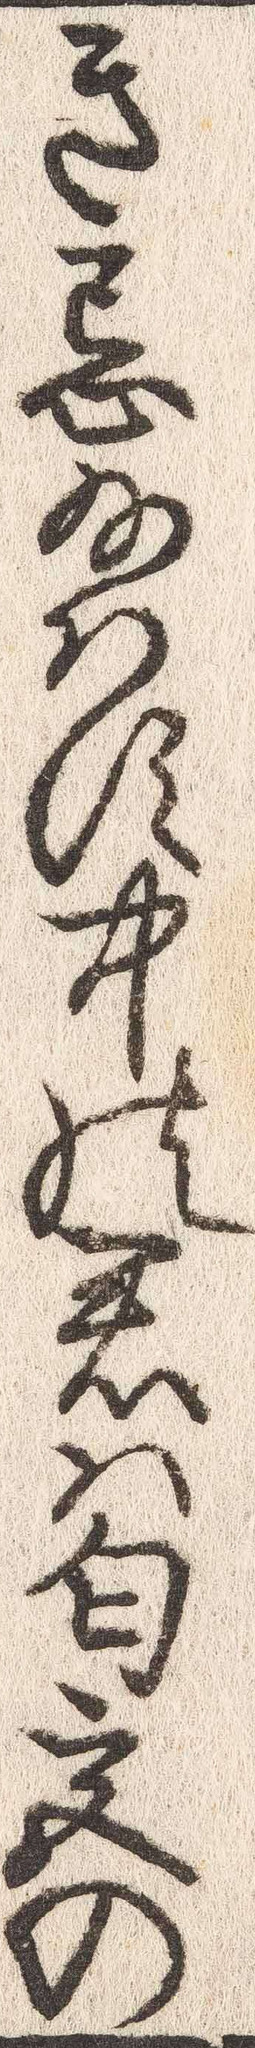き忘給はす中の君は匂宮の
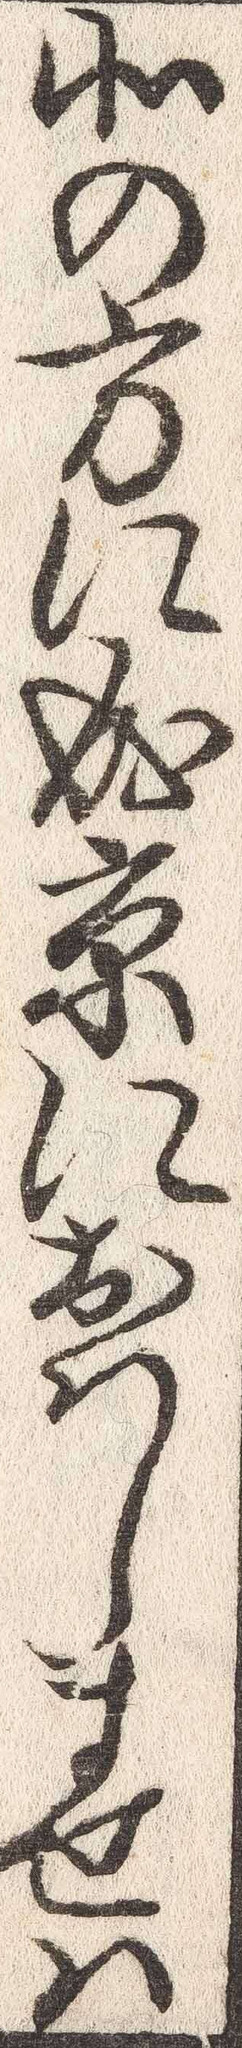北の方に成京におはしませは
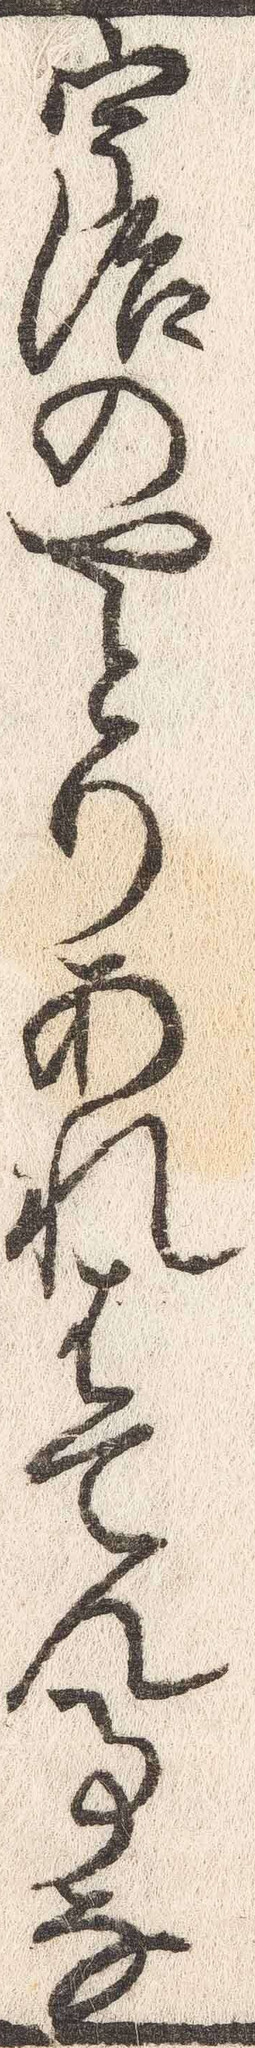宇治のやとりあれはてん事な
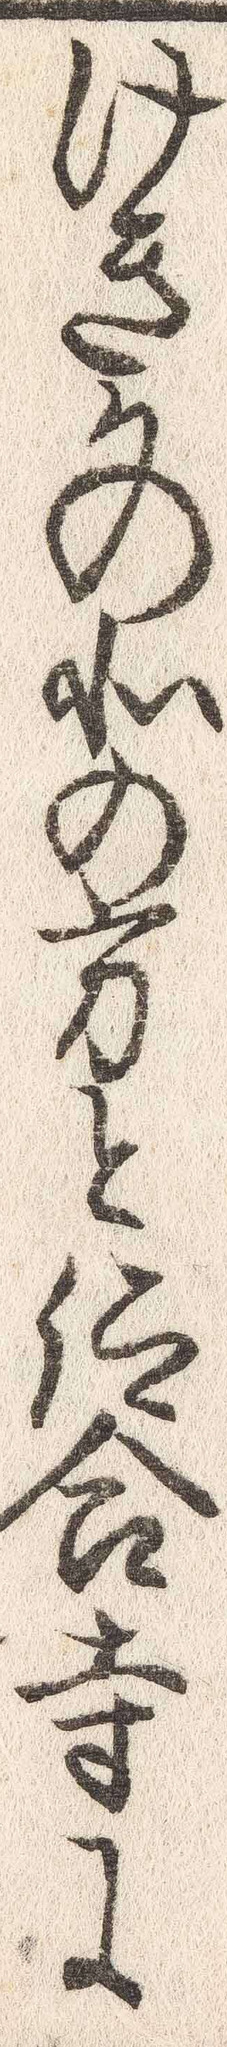けきかの北の方と仰合寺に
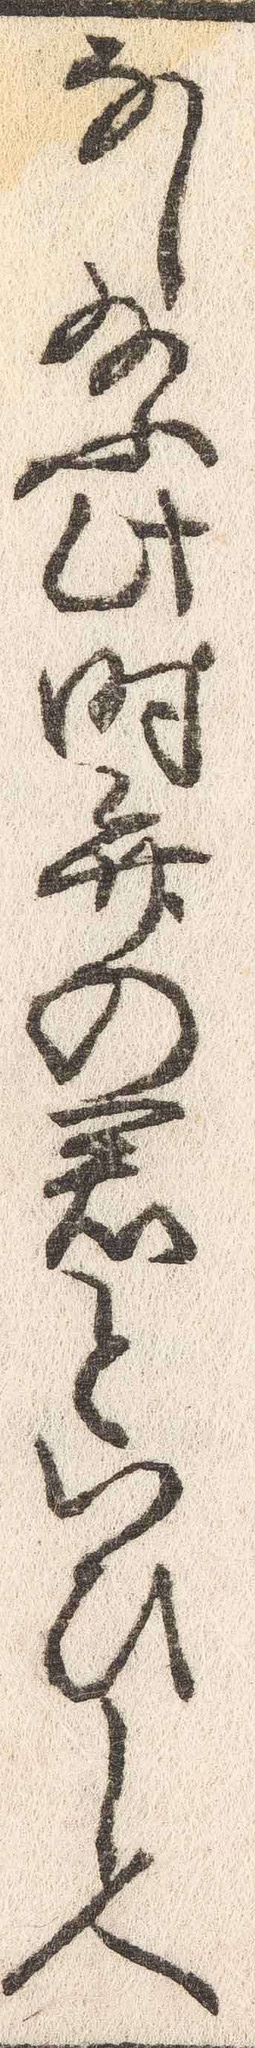なし給ふ此時弁の君といひし人
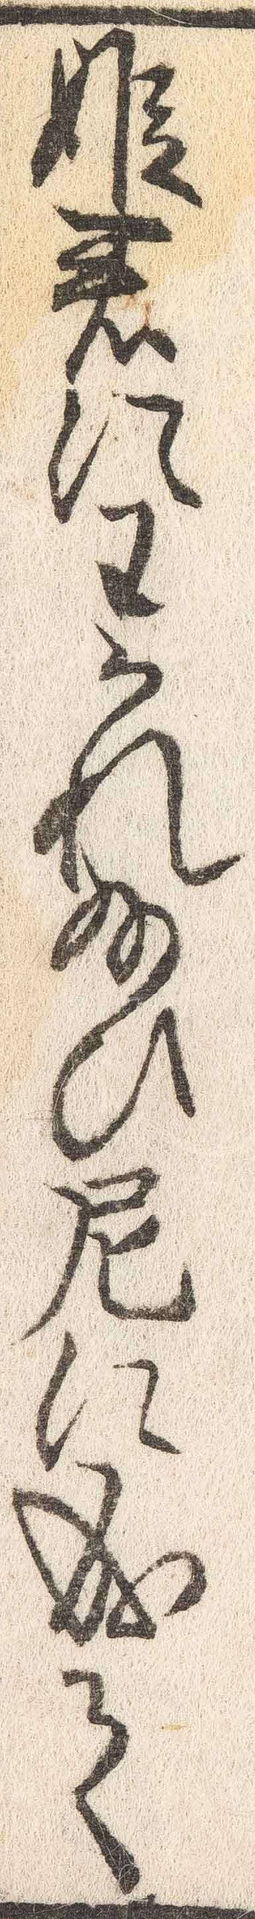姫君にわかれ給ひ尼に成て

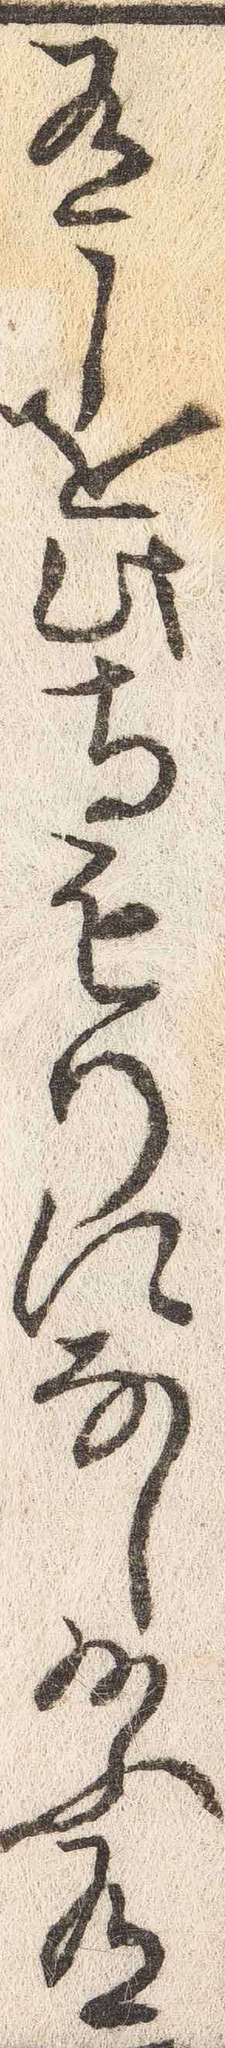有しを此寺もりになし給ふ有
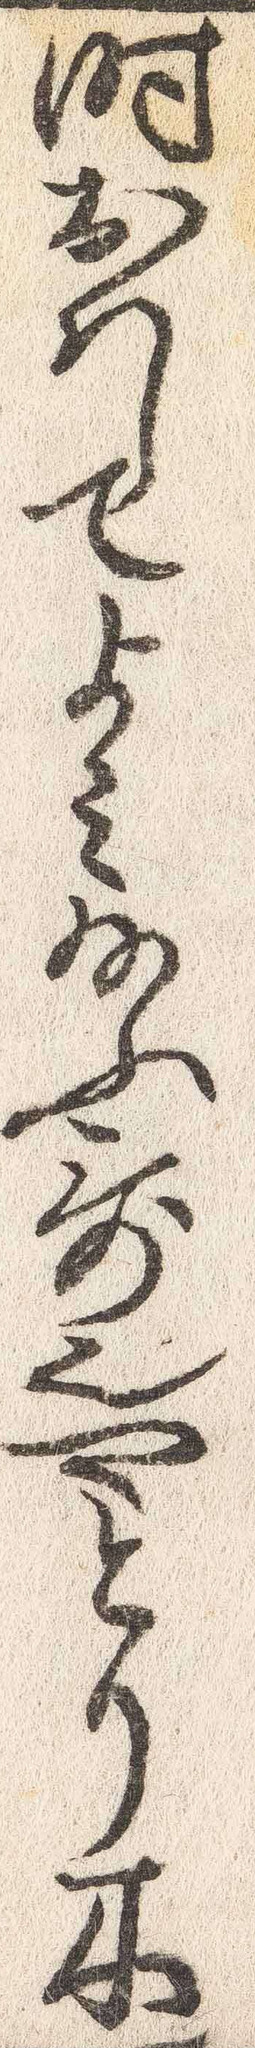時おはしてよみ給ふ哥也やとり木
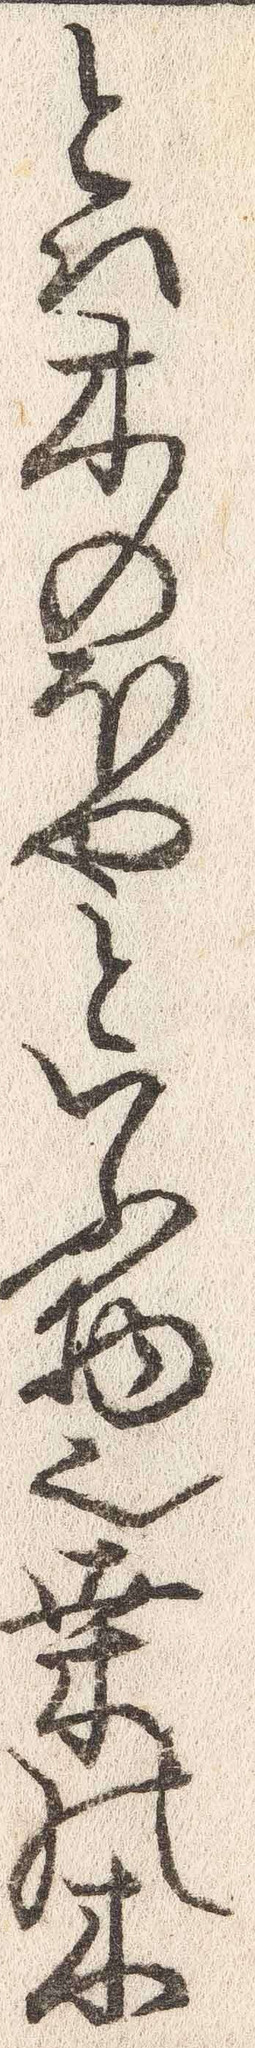とは木のほやといふ物也桑の木
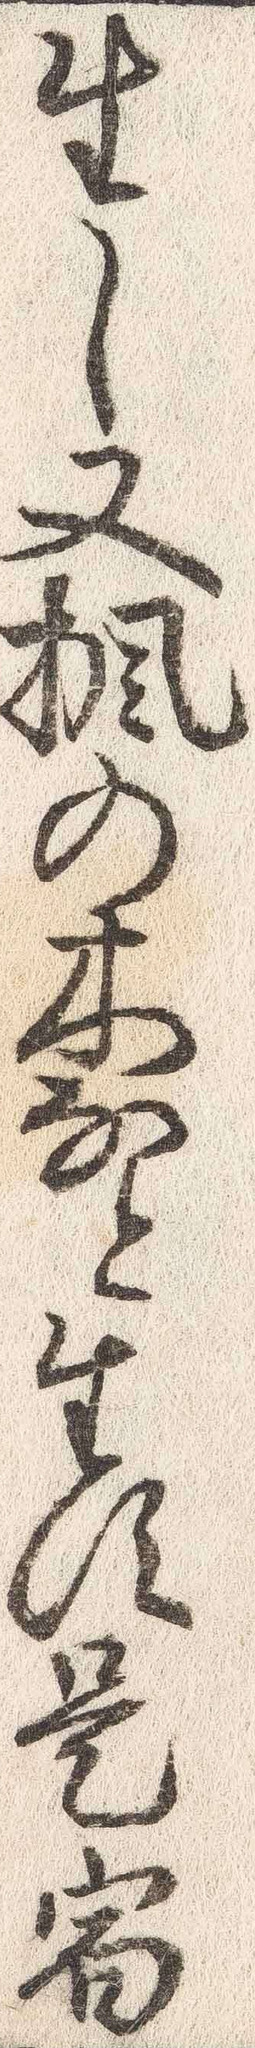生し又楓の木なと生す是宿る
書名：源氏物語
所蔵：東京学芸大学附属図書館 国文学研究資料館
